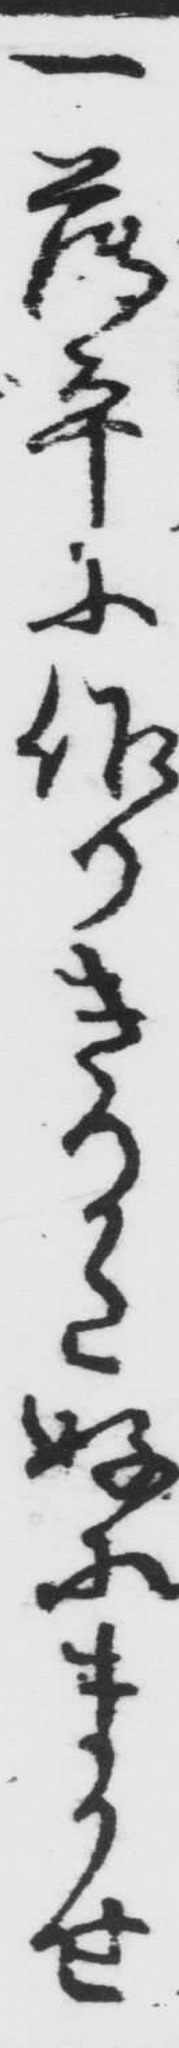一薄平に作りきりかた好にまかせ
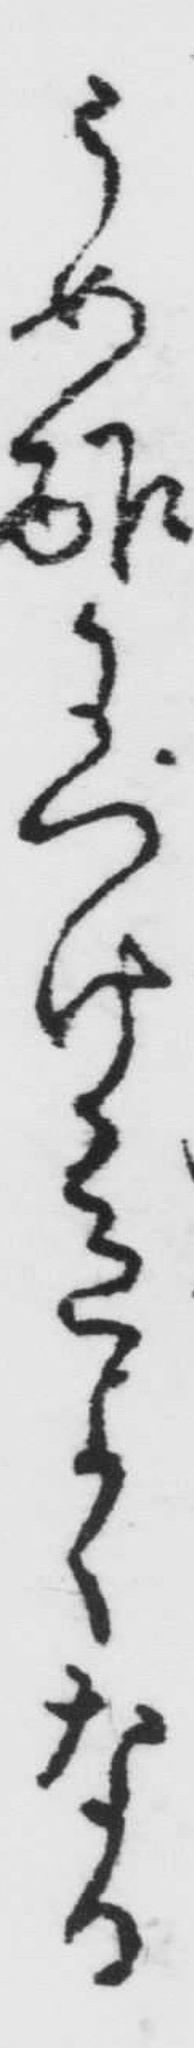うめ酢につけ色よくなる

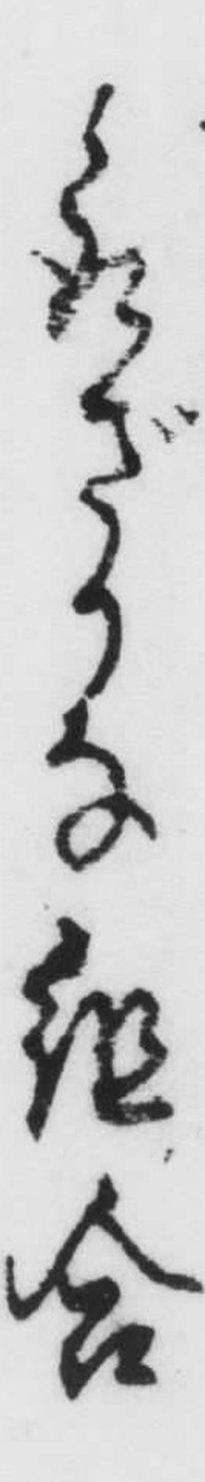取ざかな組合
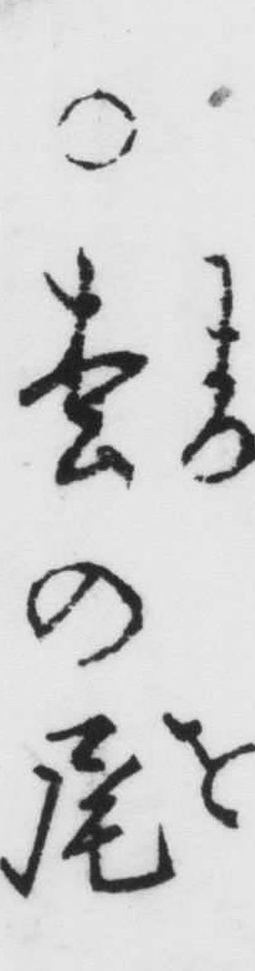○松の尾
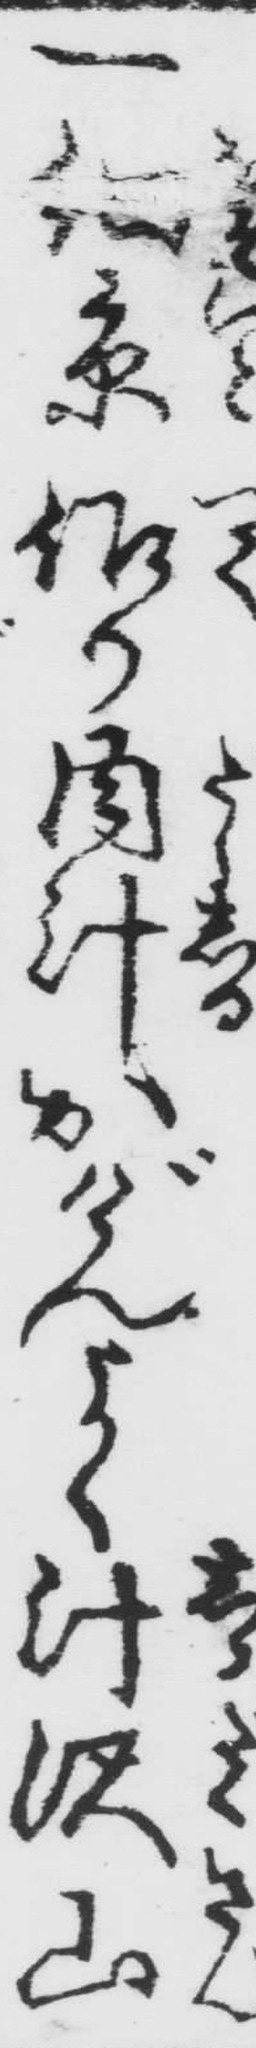一細糸作り肉汁かげんよく汁沢山
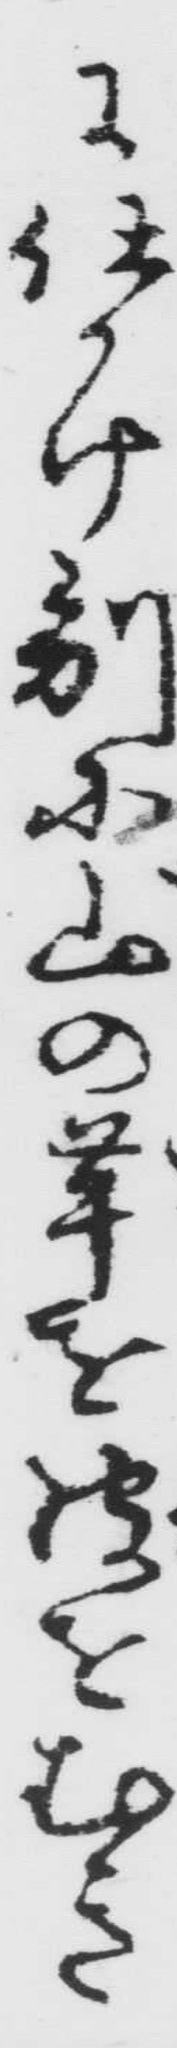に仕かけ別に山の芋を皮をむき
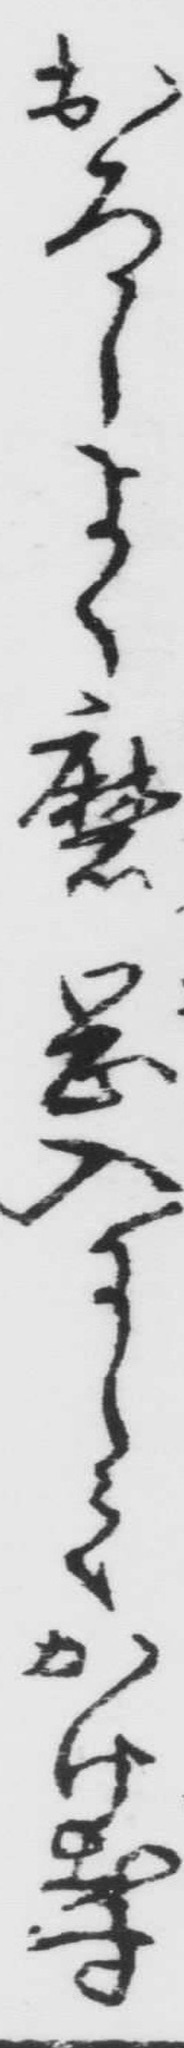おろしよく磨岡入にしてかけ出す
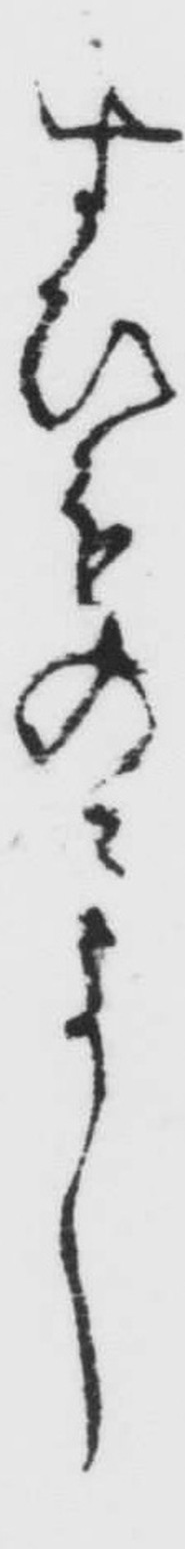すひものによし
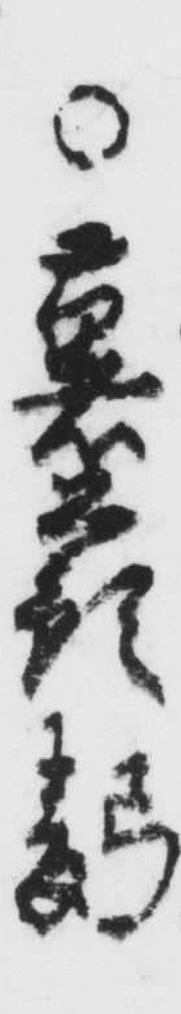○薯蕷麺
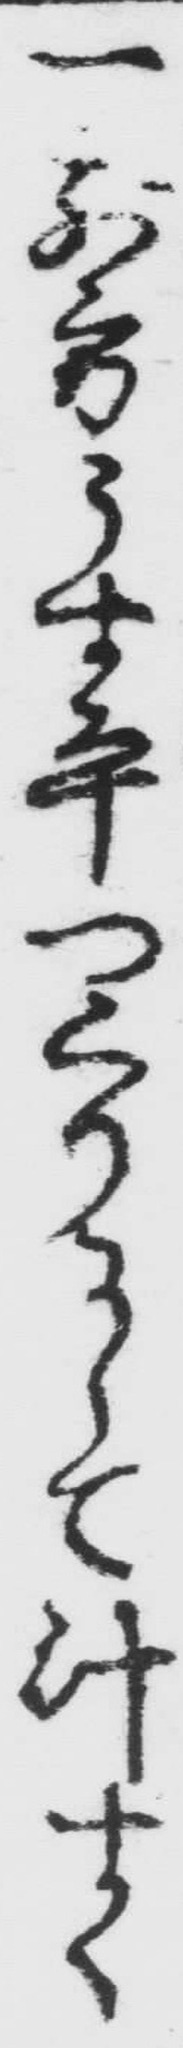一前方うす平づくりにして汁すく
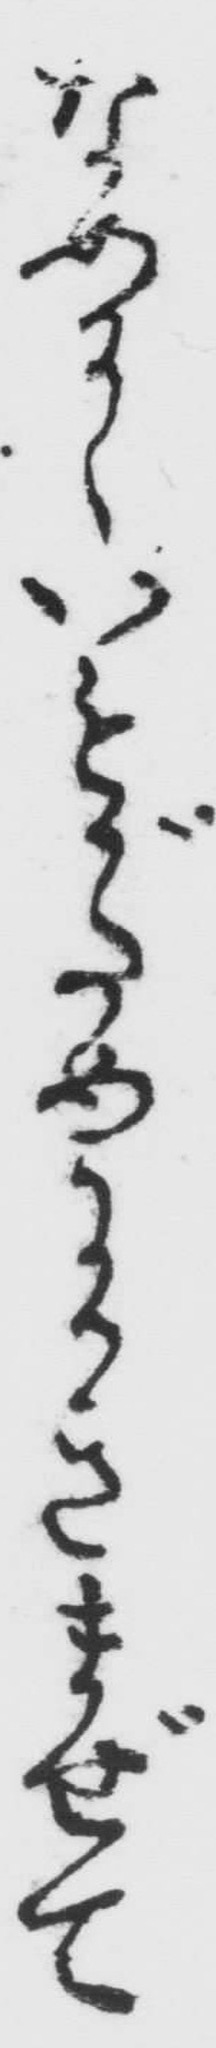なめにしいもがためにかきまぜて
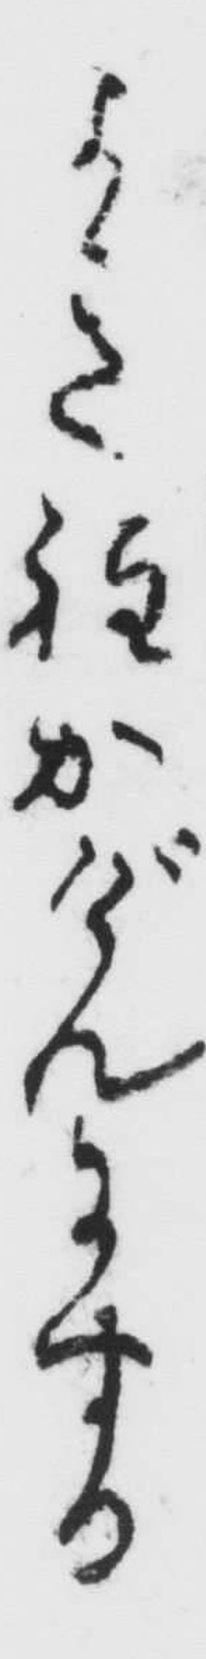よき程かげんにする
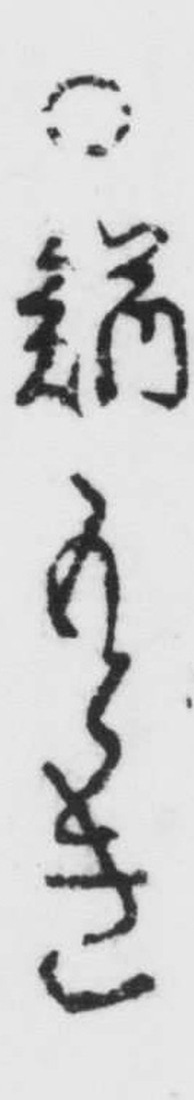○鰌もどき

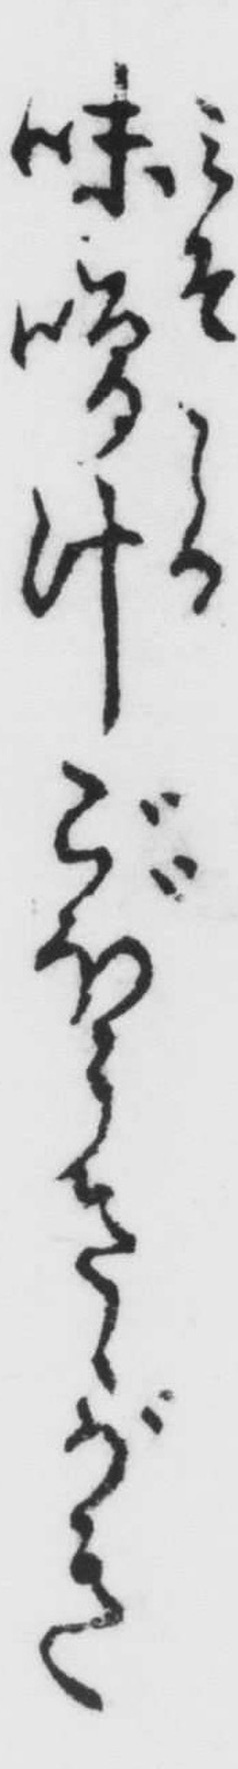味噌汁ごばうさゝがき
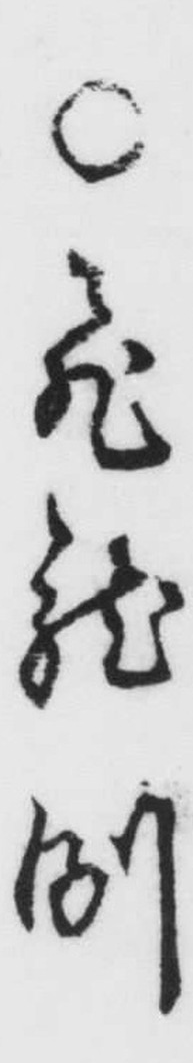○飛龍酢
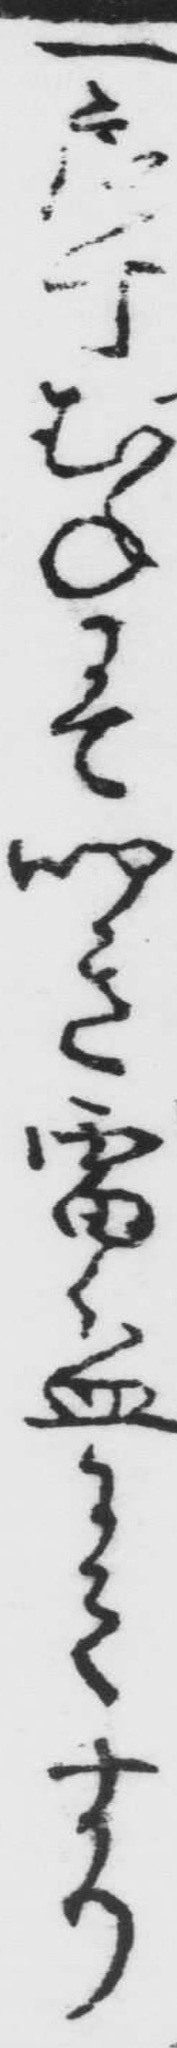一庖丁むねにて叩き雷盆にてすり
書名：蒟蒻百珍
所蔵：大阪府立大学学術情報センター 国文学研究資料館
